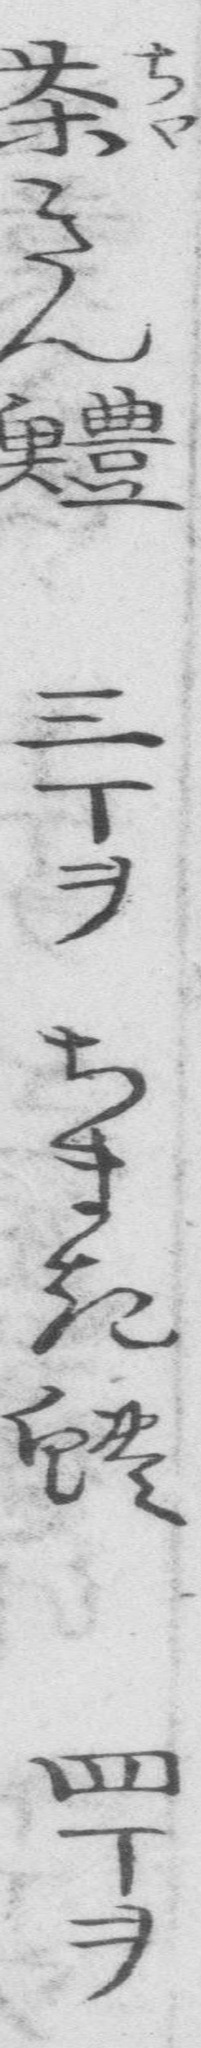茶きん鱧三丁ヲちまき鱧四丁ヲ
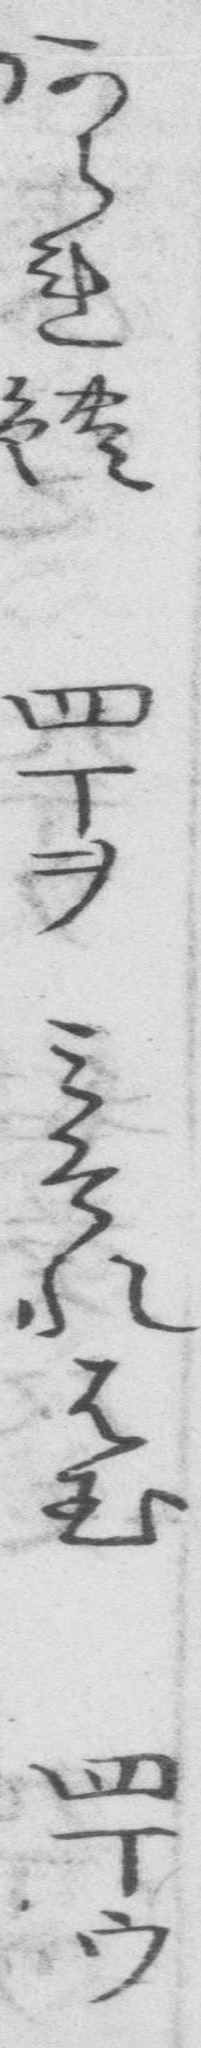あられ鱧四丁ヲみそれはむ四丁ウ
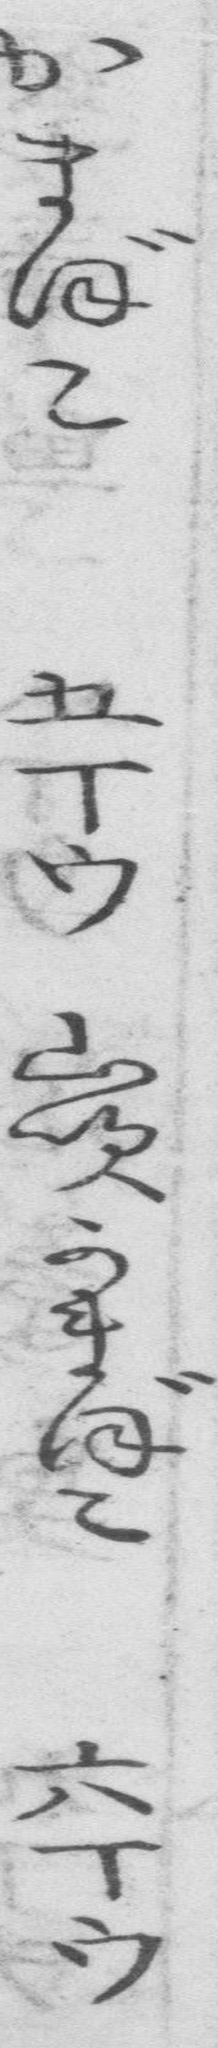かまぼこ五丁ウ山吹かまぼこ六丁ウ
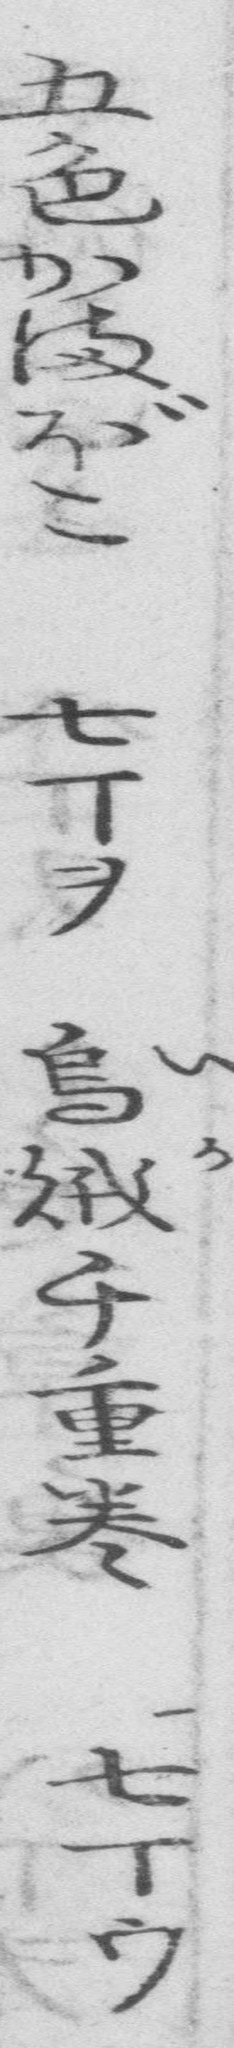五色かまぼこ七丁ヲ烏賊千重巻七丁ウ

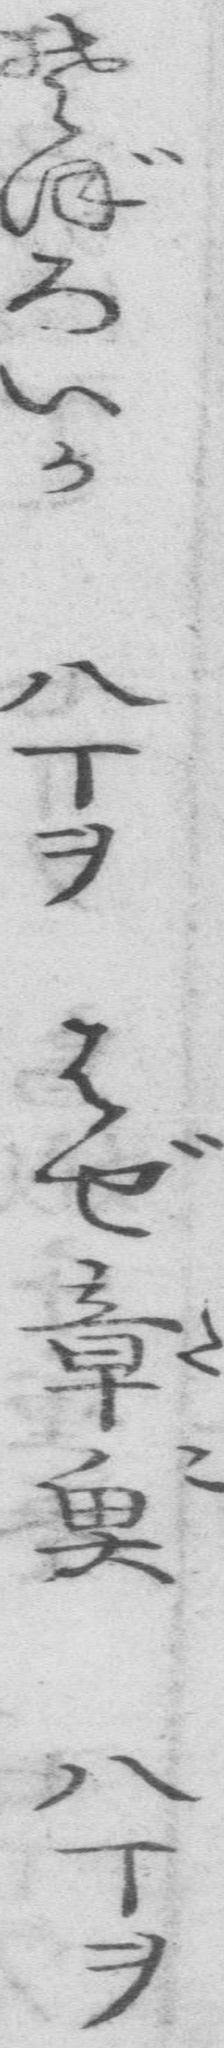そぼろいか八丁ヲはぜ章魚八丁ヲ
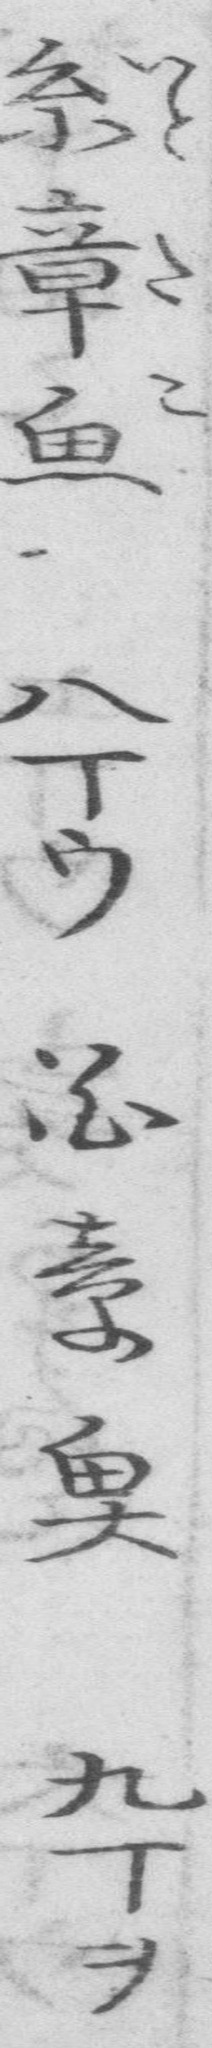糸章魚八丁ウ花章魚九丁ヲ
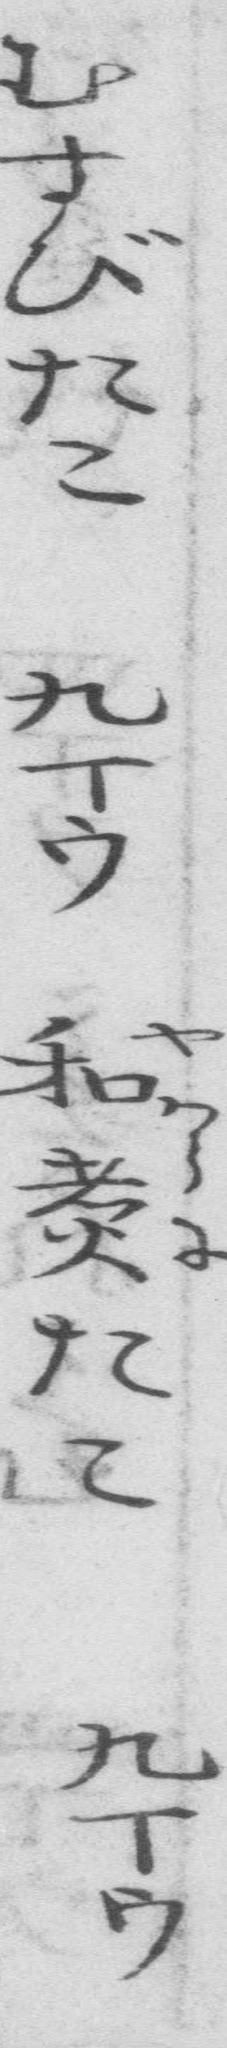むすびたこ九丁ウ和煮たこ九丁ウ
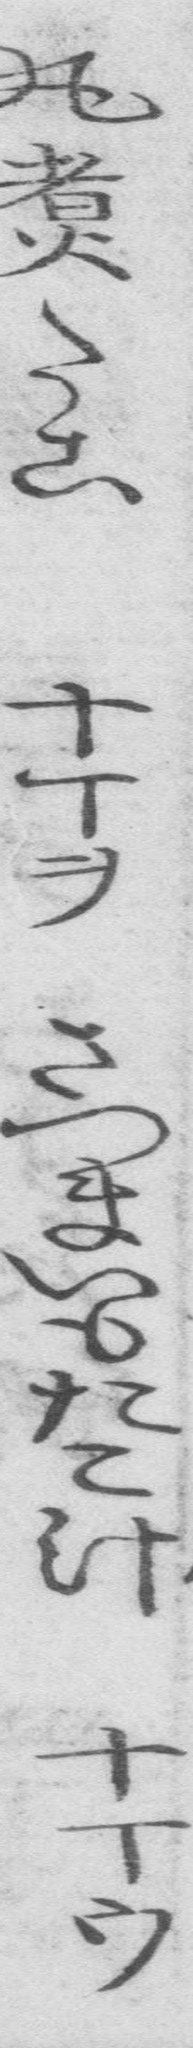丸煮たこ十丁ヲさつまいもたこ汁十丁ウ
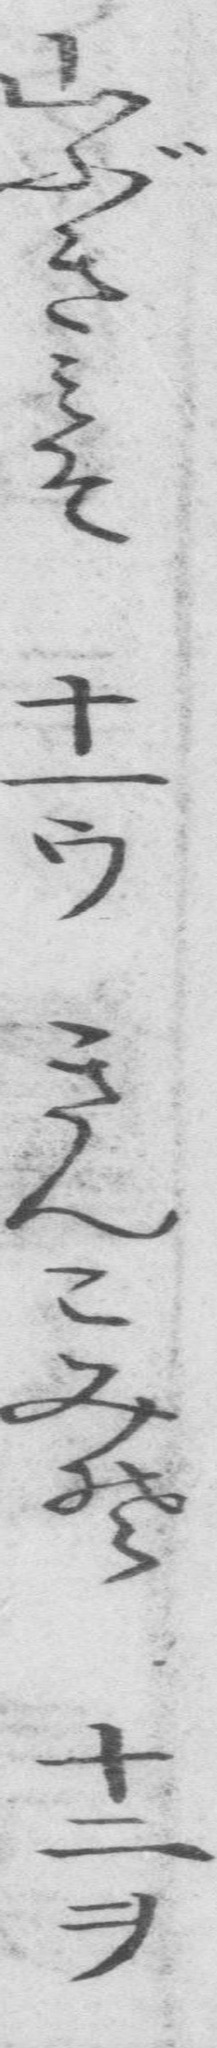山ぶきみそ十一ウきんこみそ十二ヲ
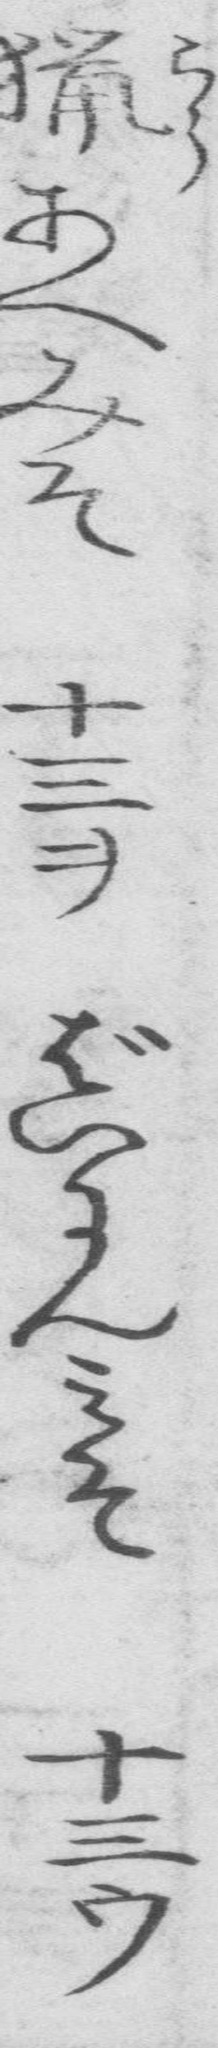猟あへみそ十三ヲばいにんみそ十三ウ
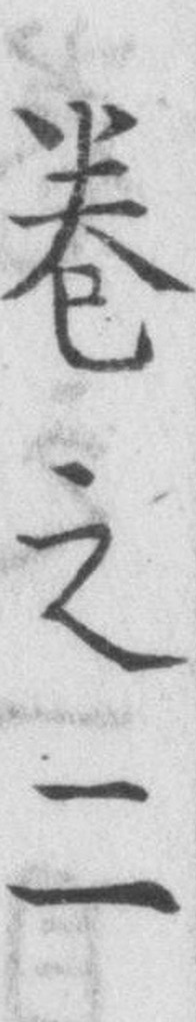巻之二
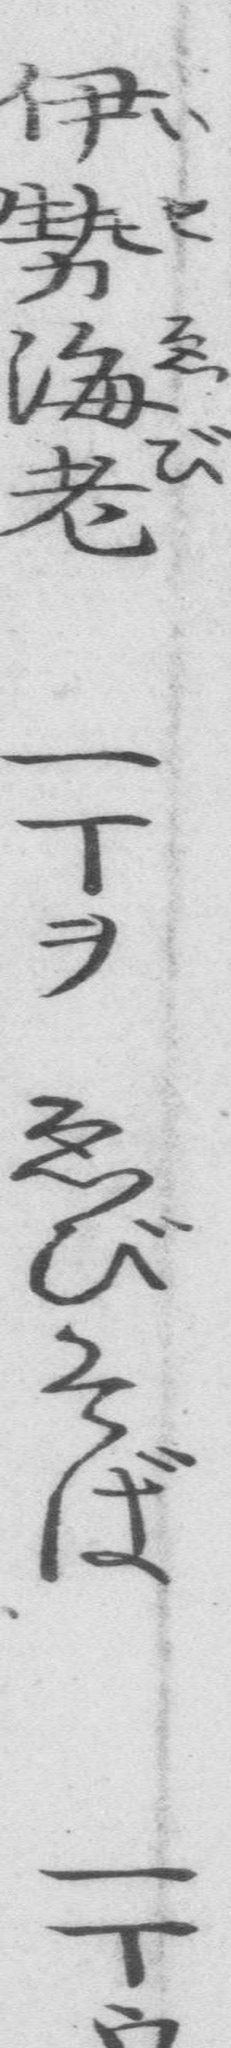伊勢海老一丁ヲゑびそば一丁ウ
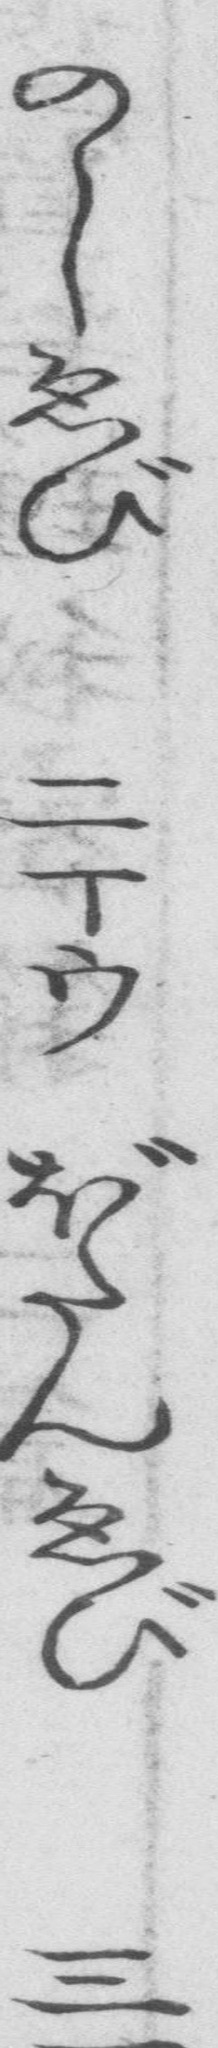のしゑび二丁ウぼたんゑび三丁ヲ
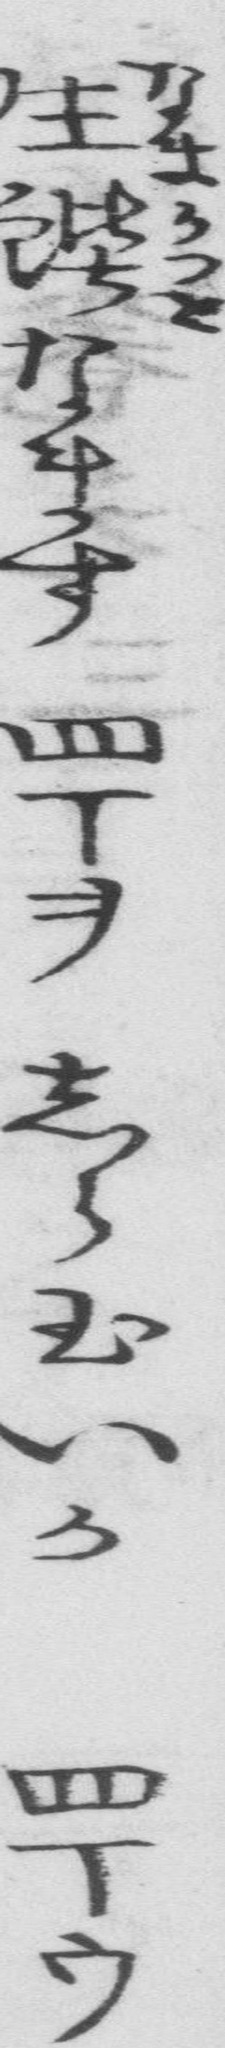生鰹なます四丁ヲしら玉いか四丁ウ
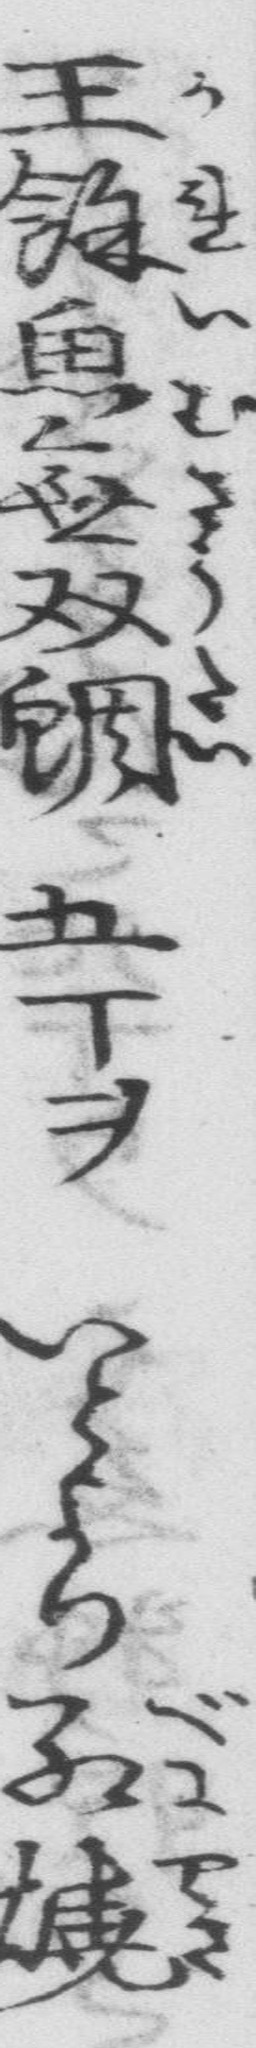王余魚無双鯛五丁ヲいとより紅焼同
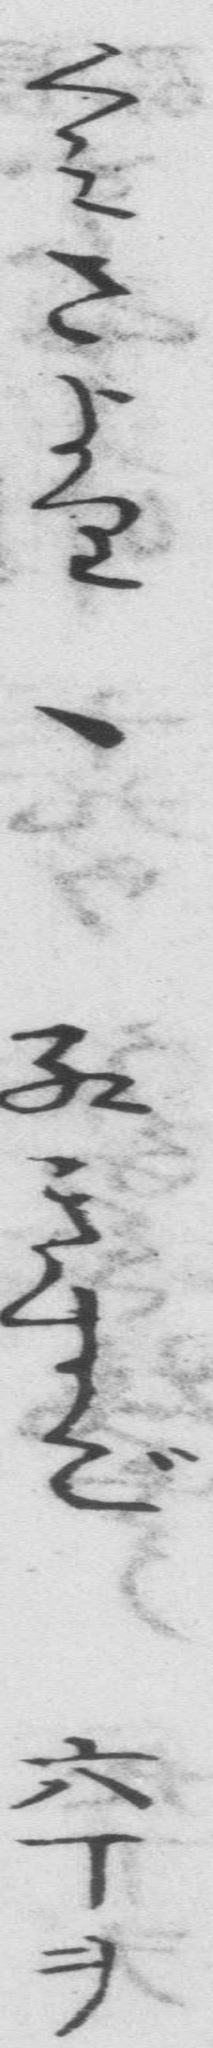くみさより同紅きすご六丁ヲ
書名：萬寳料理秘密箱
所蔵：大阪府立大学学術情報センター 国文学研究資料館
